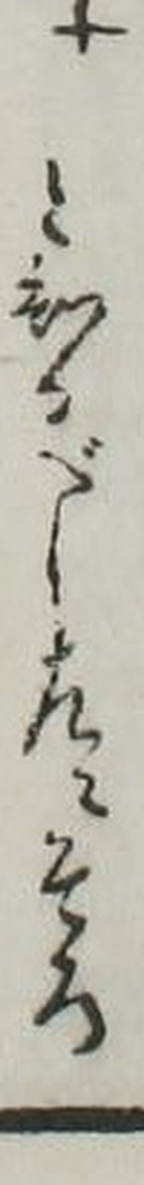と知るべし左にそろ
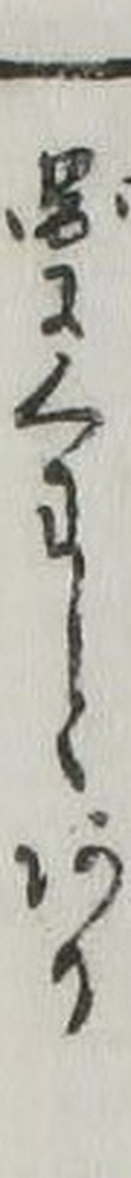図にくわしくあり
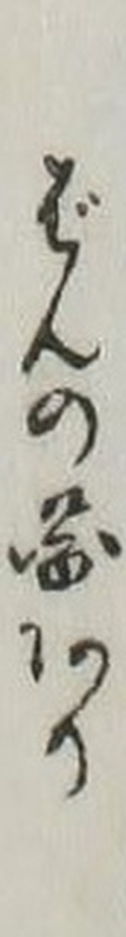ばんの図あり
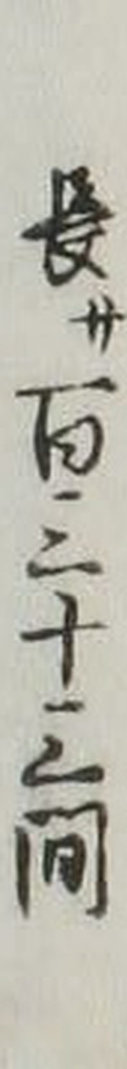七百三十三間
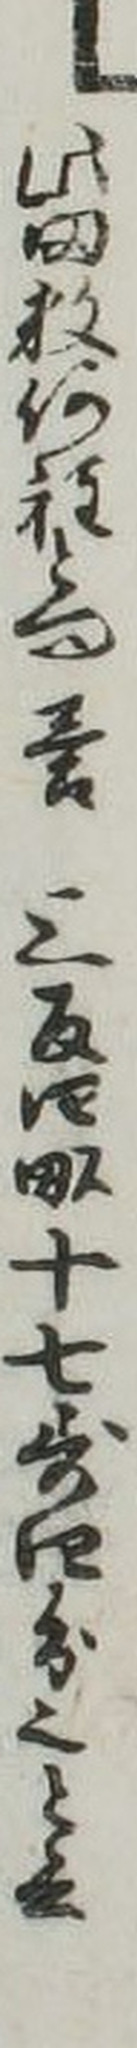此田数何程と問答三反四畝十七歩四分也と云
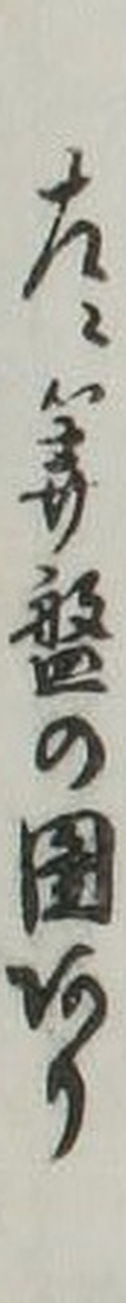左に算盤の図あり

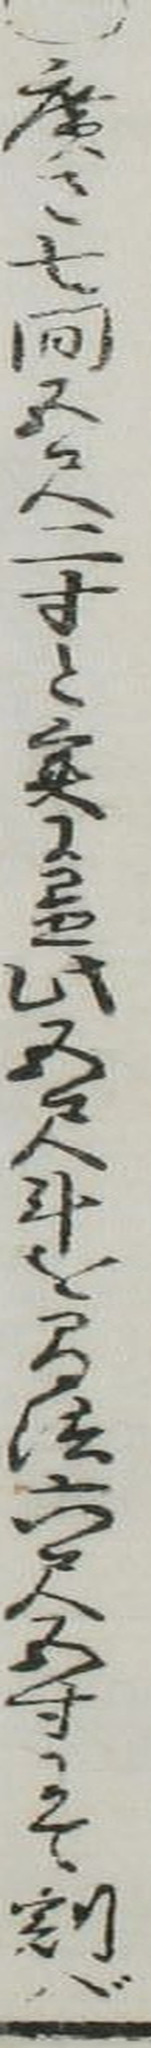◇◇◇○広さ七間五尺二寸と実に置此五尺計を間法六尺五寸にて割ば
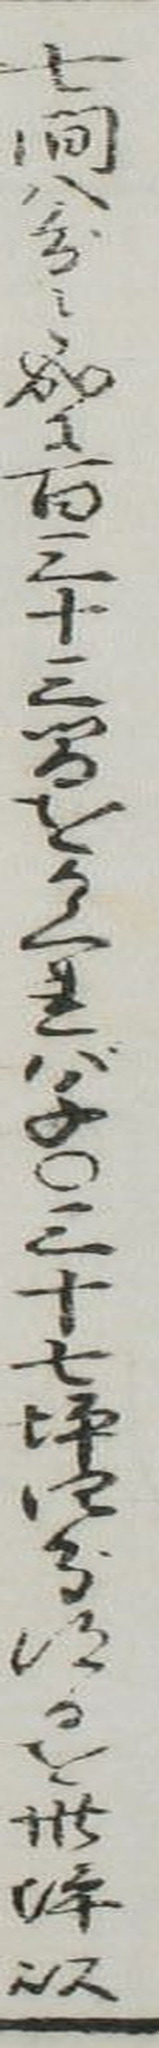◇◇◇七間八分と成に百三十三間をかくれば千〇三十七坪四分得るを卅坪以
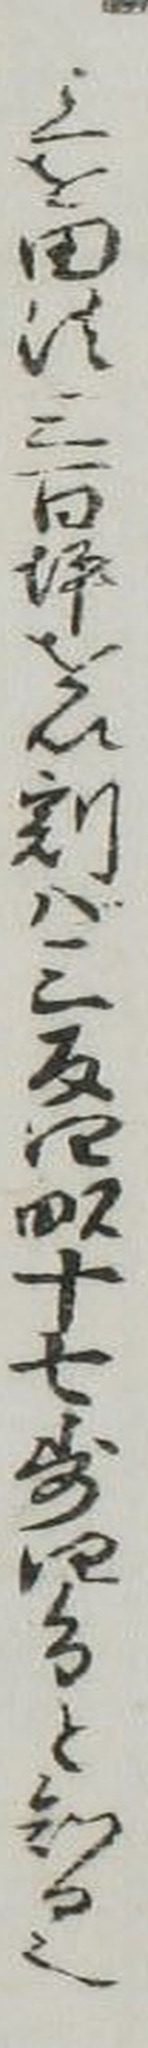◇上を田法三百坪を以割ば三反四畝十七歩四分と知る也
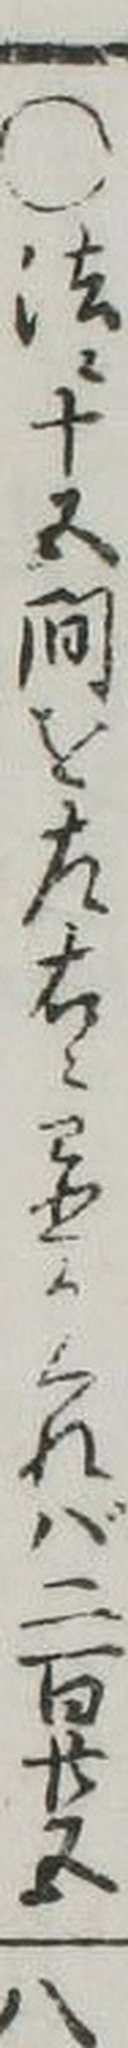○法に十五間を左右に置かくれば二百廿五
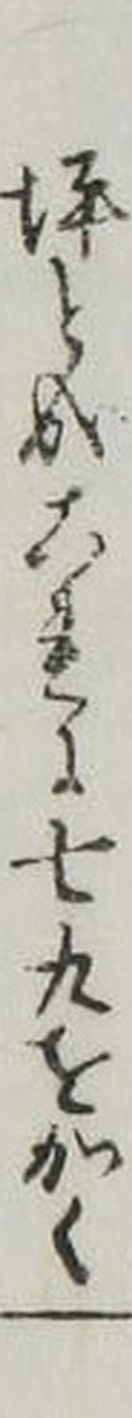坪と成これに七九をかく
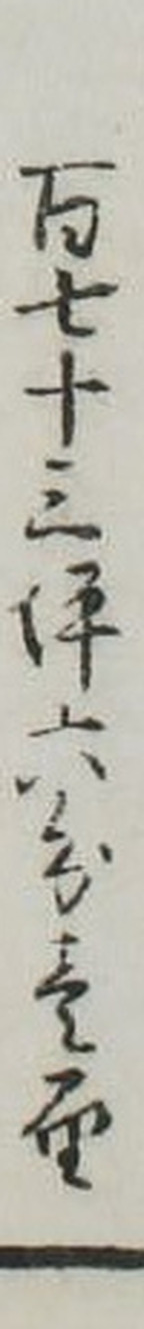百七十三坪六分壱厘
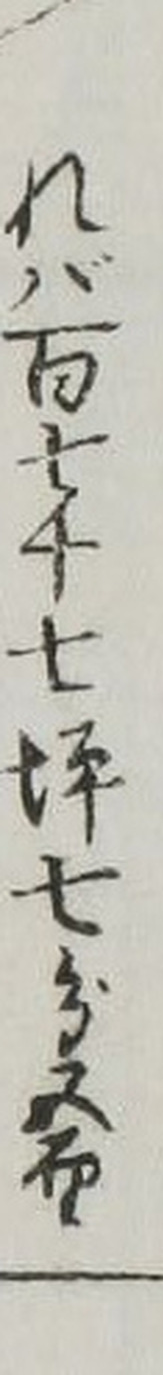れば百七十七坪七分五厘
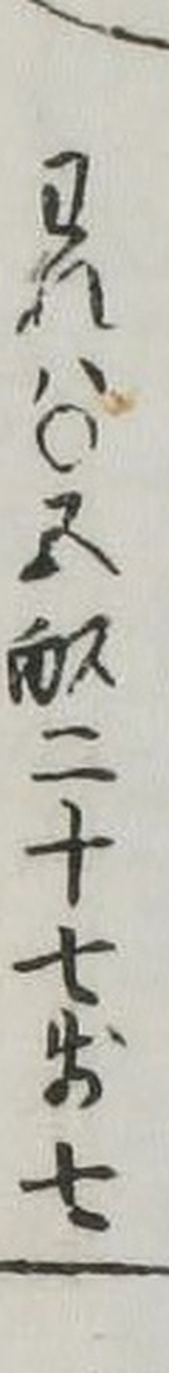われは〇五畝二十七歩七
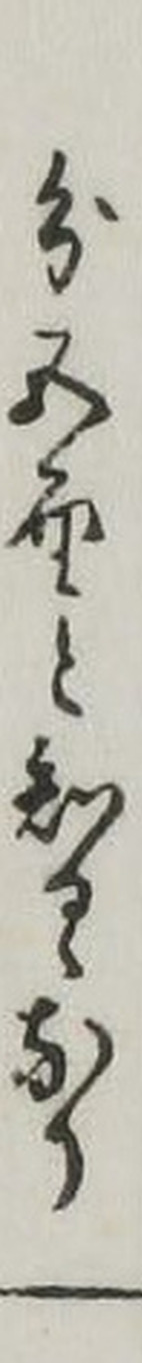分五厘と知るゝなり
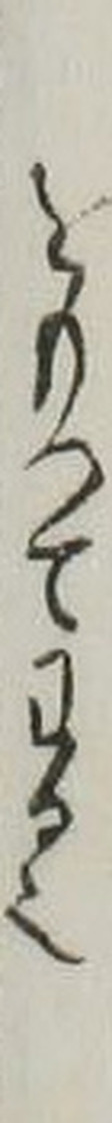同をもってわる也
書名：宝玉塵劫記
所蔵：東京学芸大学教育コンテンツアーカイブ
